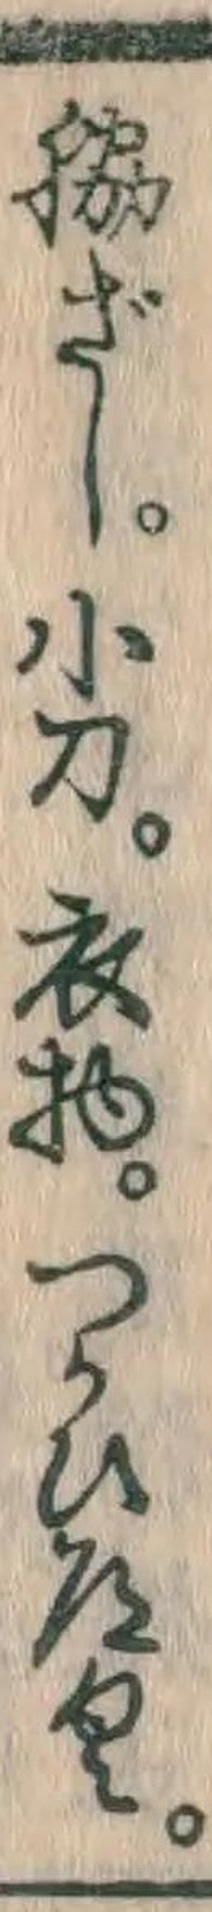脇ざし。小刀。衣物。つかひ道具。
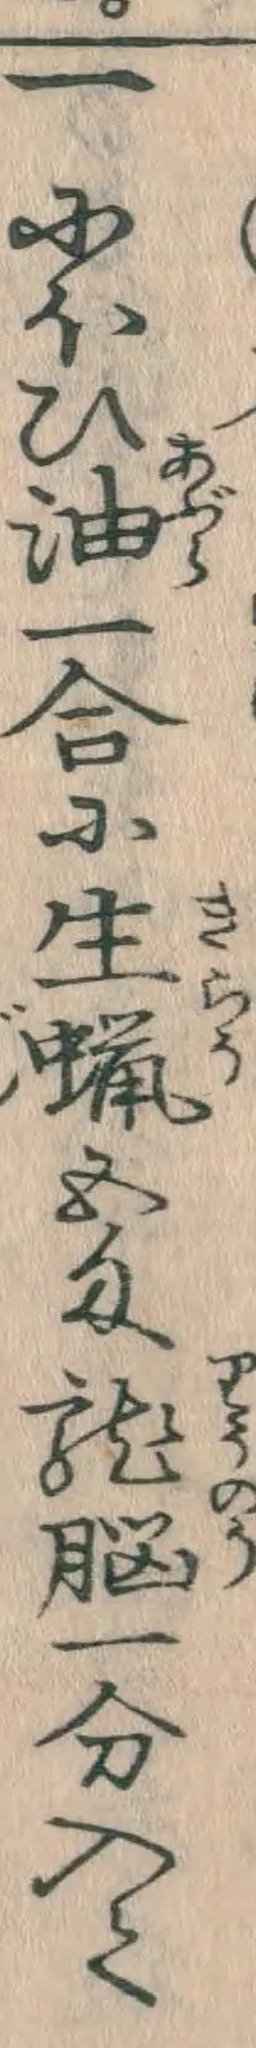一にほひ油一合に生蠟五匁竜脳一分入て
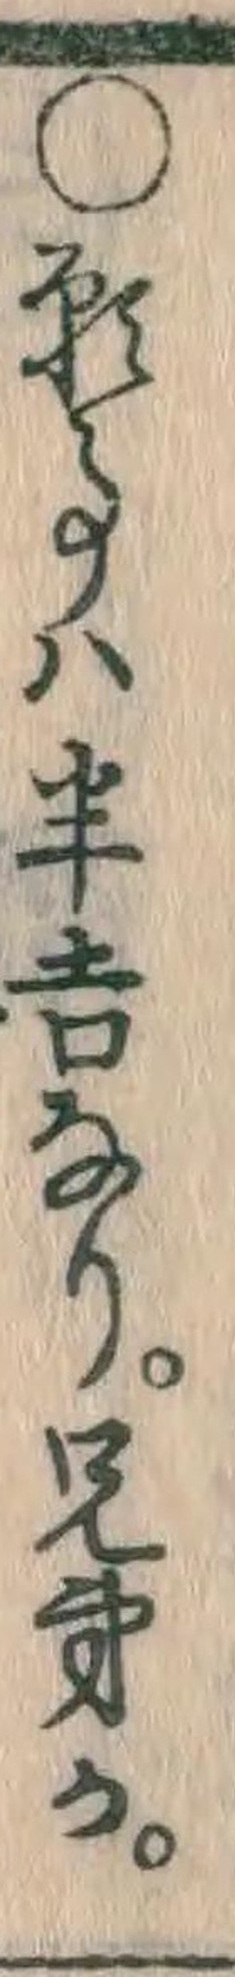○願事は半吉なり。兄弟か。
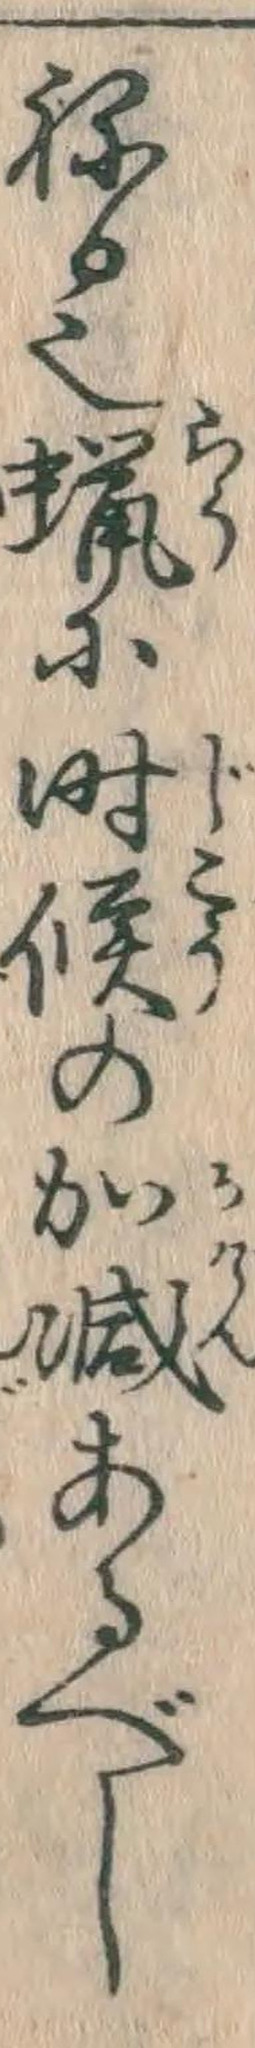ねる也蠟に時候の加減あるべし
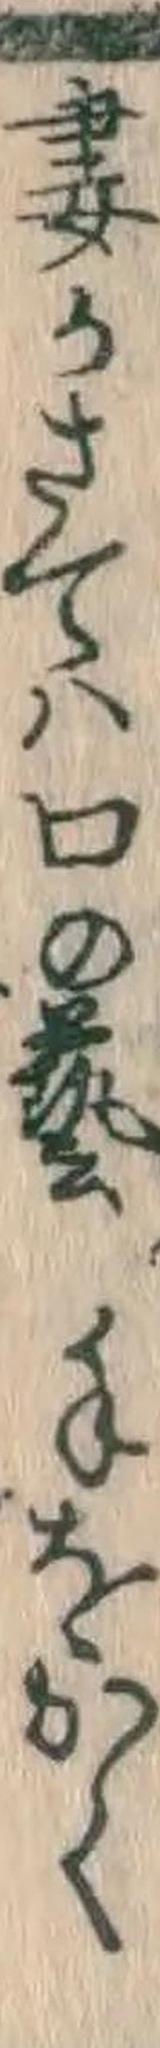妻かさては口の芸。手をかく
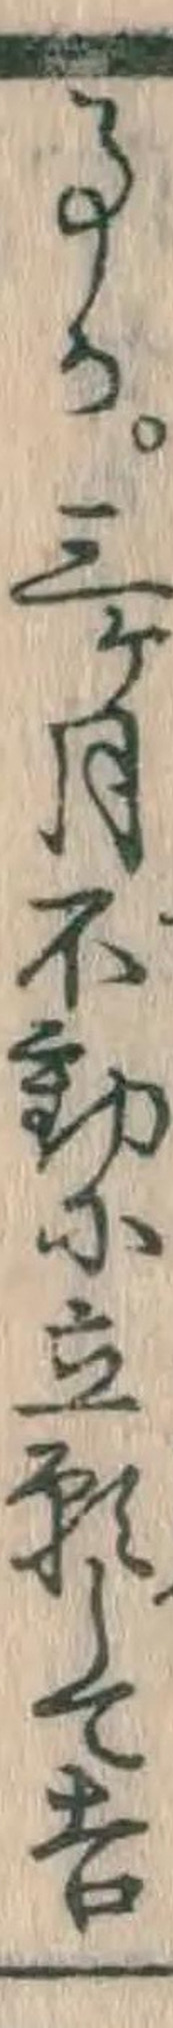事か。三ヶ月不動に立願して吉
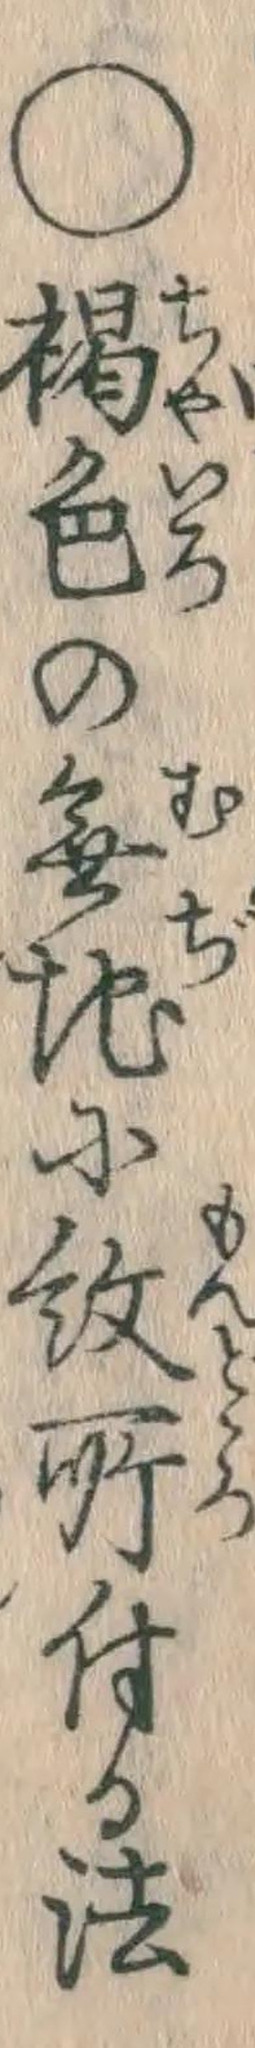○褐色の無地に紋所付る法
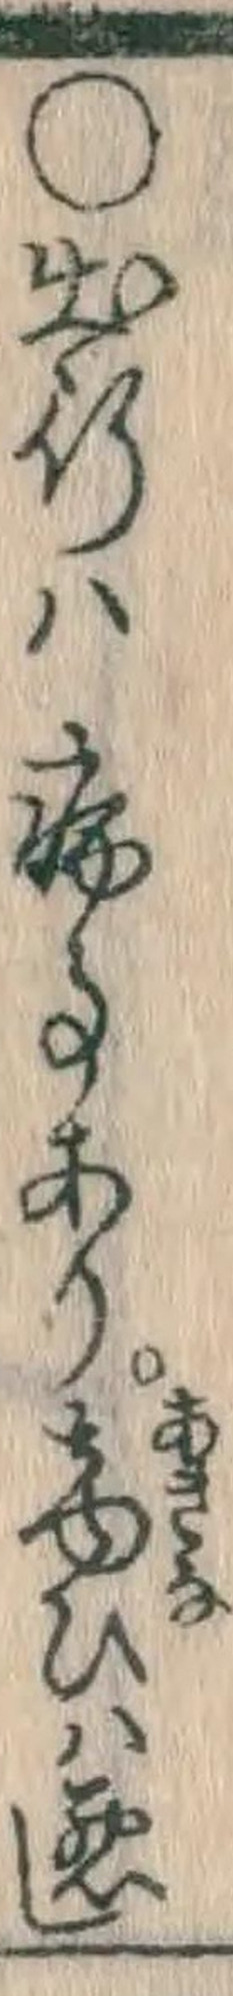○出行は病事あり。商ひは悪し。
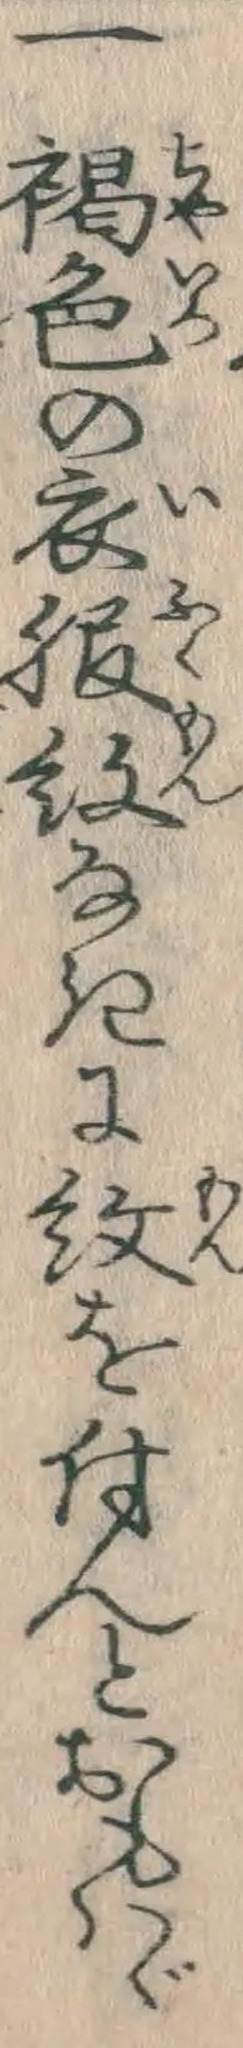一褐色の衣服紋なきに紋を付んとおもはゞ
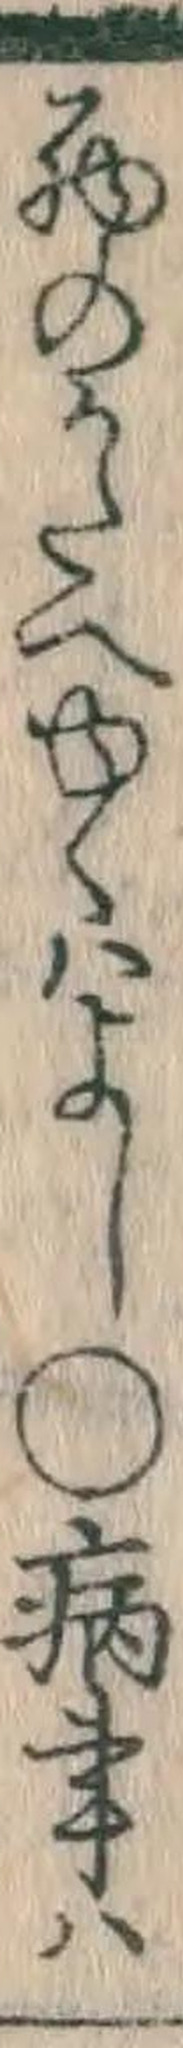西のかたへゆくはよし○病事は
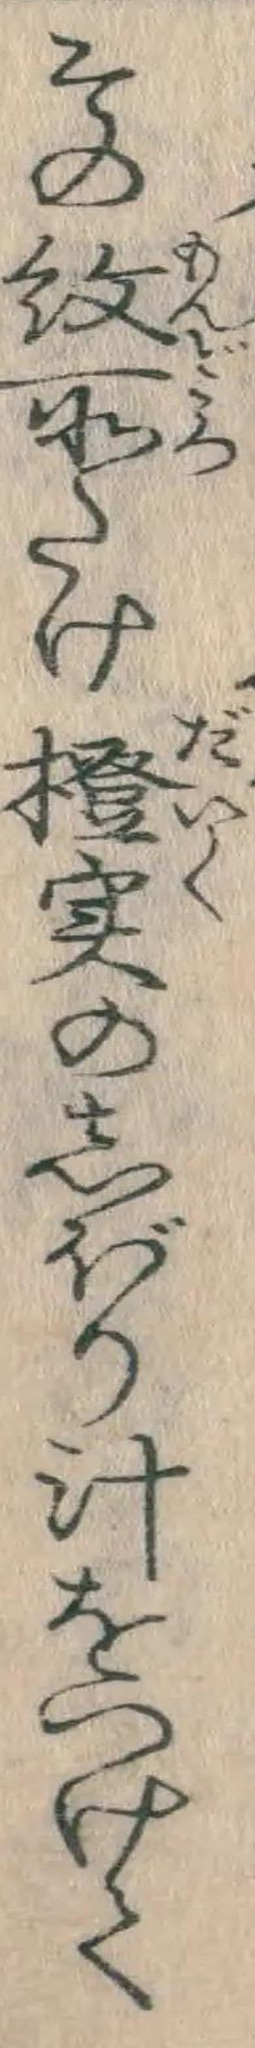その紋所たけ橙実のしぼり汁をつけて
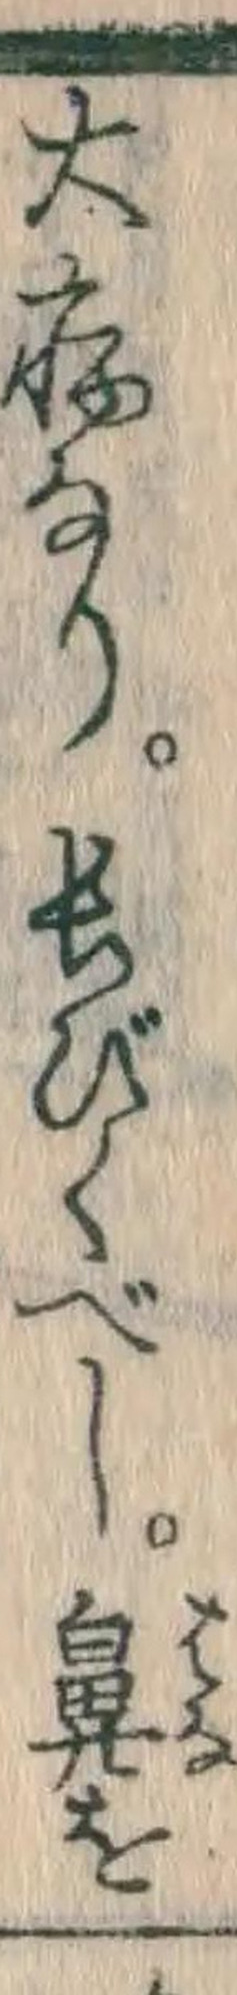大病なり。長びくべし。鼻を
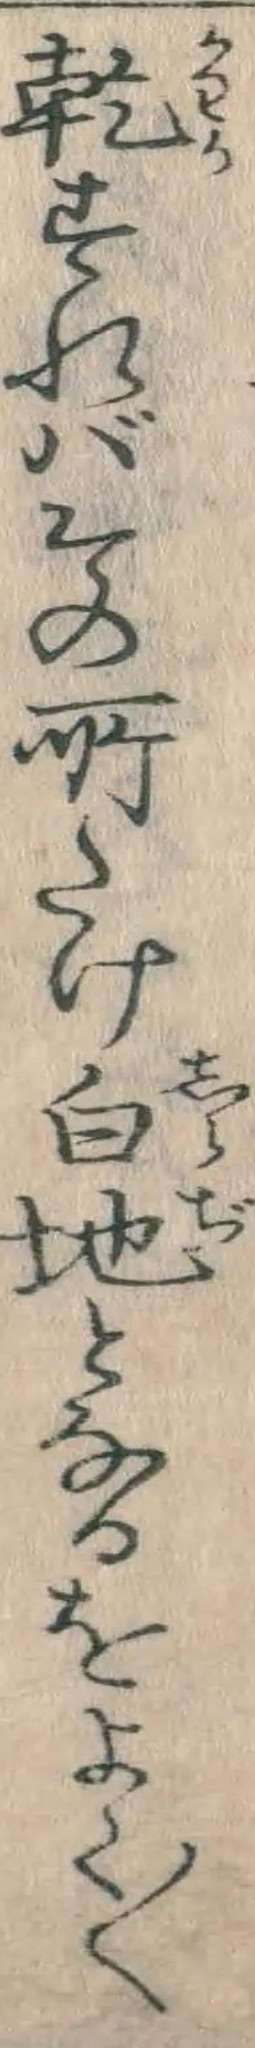乾すればその所たけ白地となるをよく〳〵
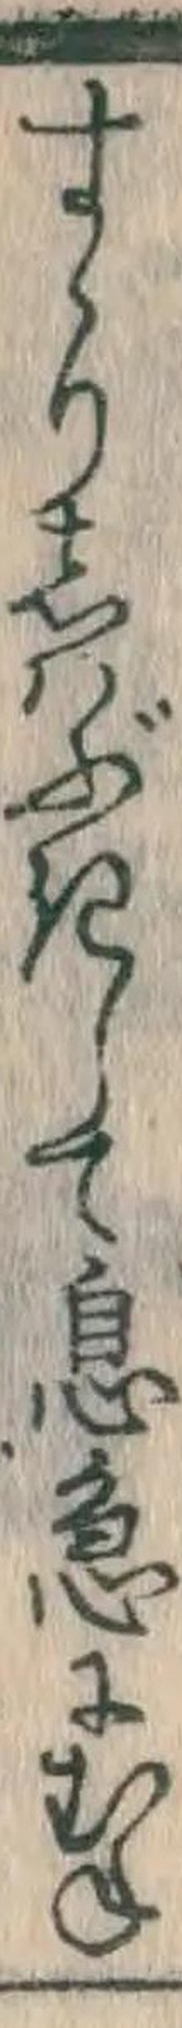すゝりしはぶきして息急にむね
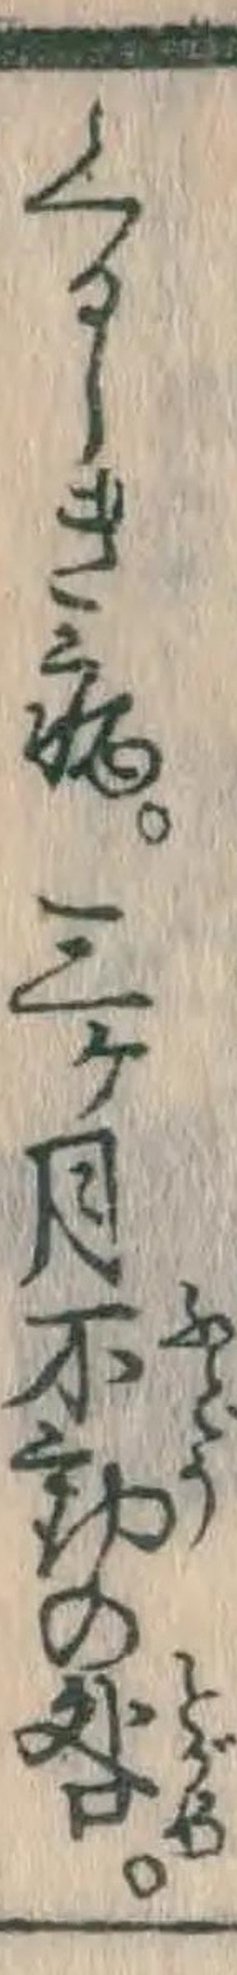くるしき病。三ヶ月不動の咎。
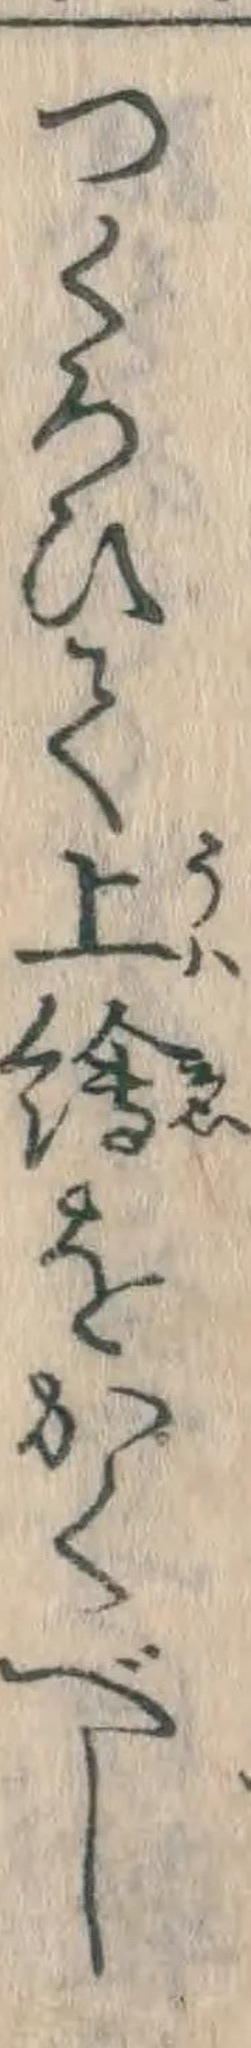つくろひて上絵をかくべし
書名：広益秘事大全 3巻. [1]
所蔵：国立国会図書館 National Diet Library, JAPAN
